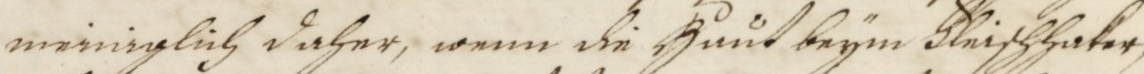meiniglich daher, wenn die Haut beym Fleischhaker,
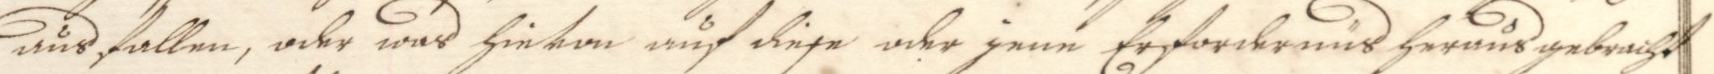ausfallen, oder was hievon auf diese oder jene Erfordernüs heraus gebracht
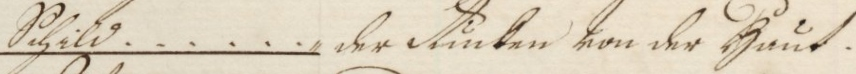Schild... der Rucken von der Haut.
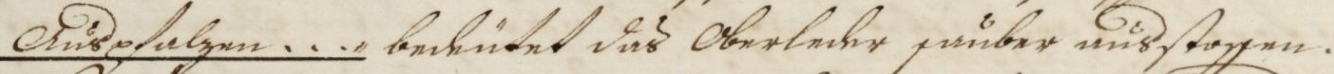Auspfalzen... bedeütet das Oberleder sauber ausstossen.
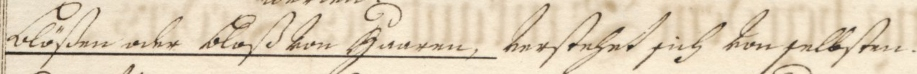Blößen oder Bloß von Haaren, verstehet sich von selbsten.
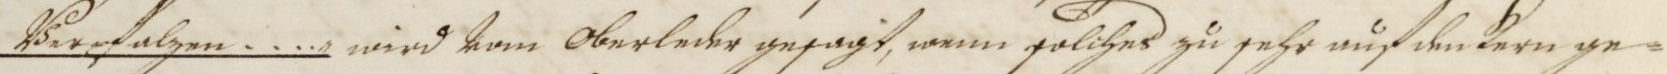Verpfalzen... wird vom Oberleder gesagt, wenn solches zu sehr auf den Kern ge-
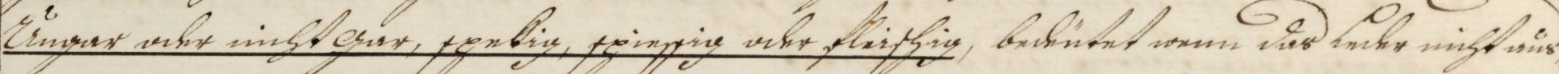Ungar oder nicht gar, spekig, spiessig oder fleischig, bedeütet wenn das Leder nicht aus-
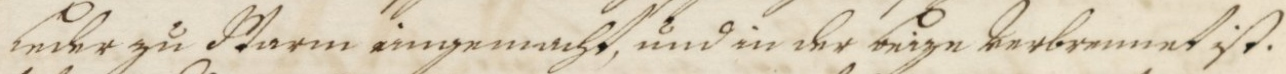Leder zu Warm eingemacht, und in der Beize verbrennet ist.
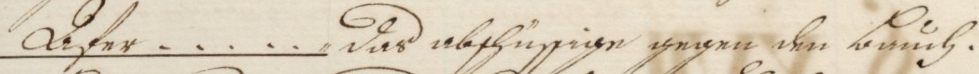Afer... das abschüssige gegen den Bauch.
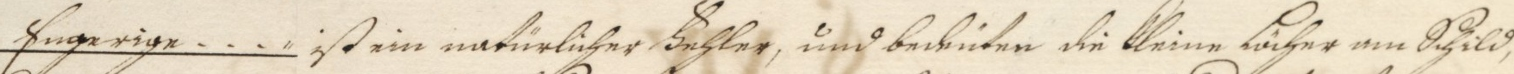Engerige... ist ein natürlicher Fehler, und bedeüten die kleine Löcher am Schild,
